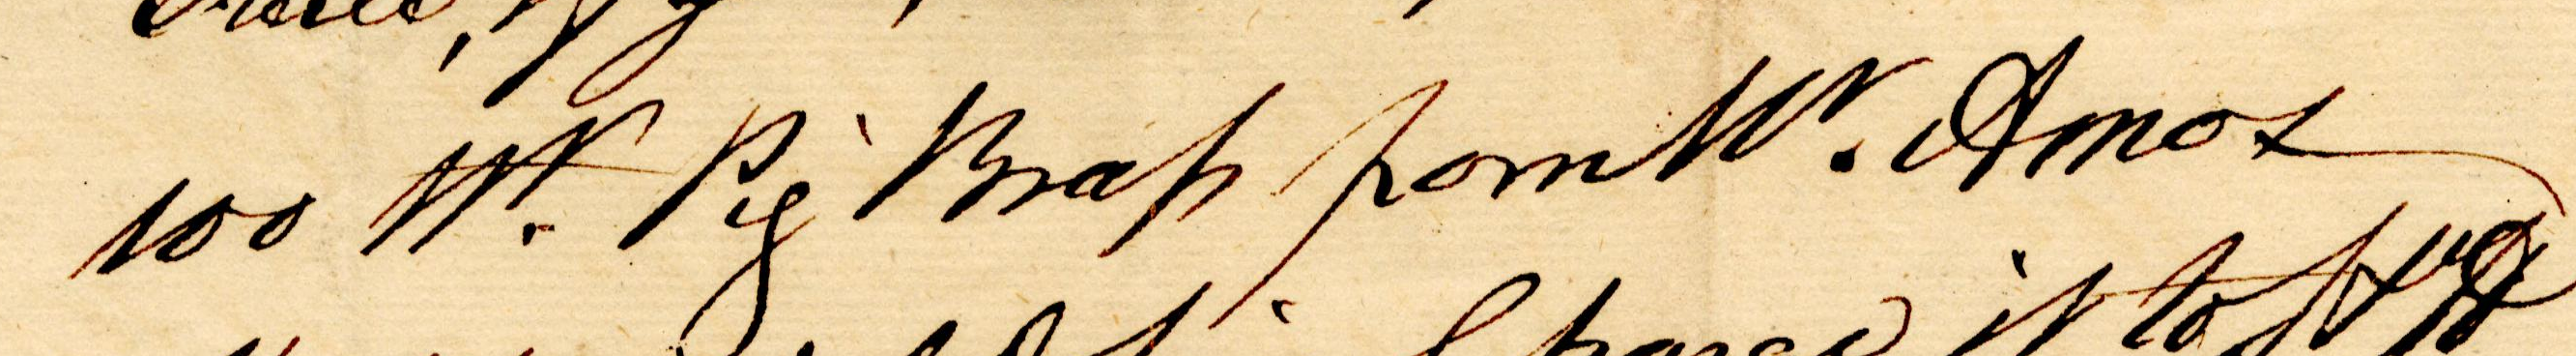100 M^r Pig Brass from Mr. Amos-
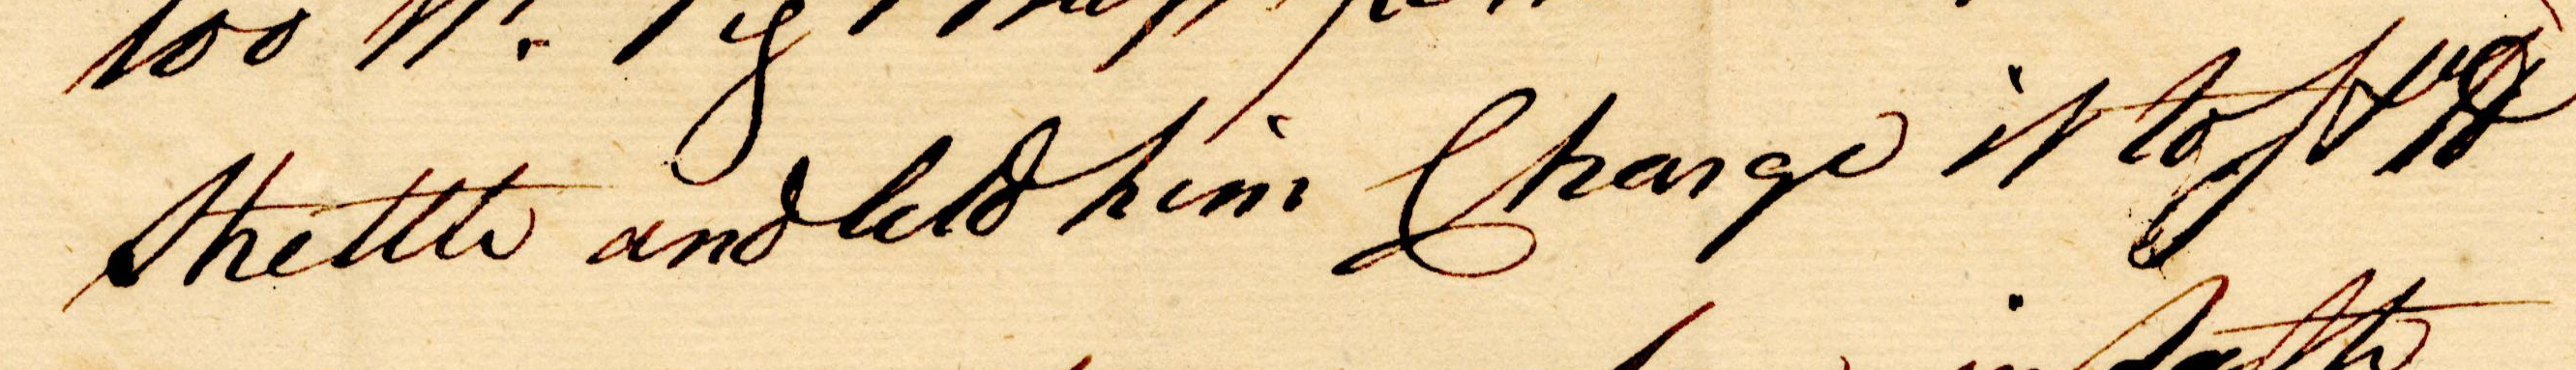Shettle and letd him Charge it to J & H
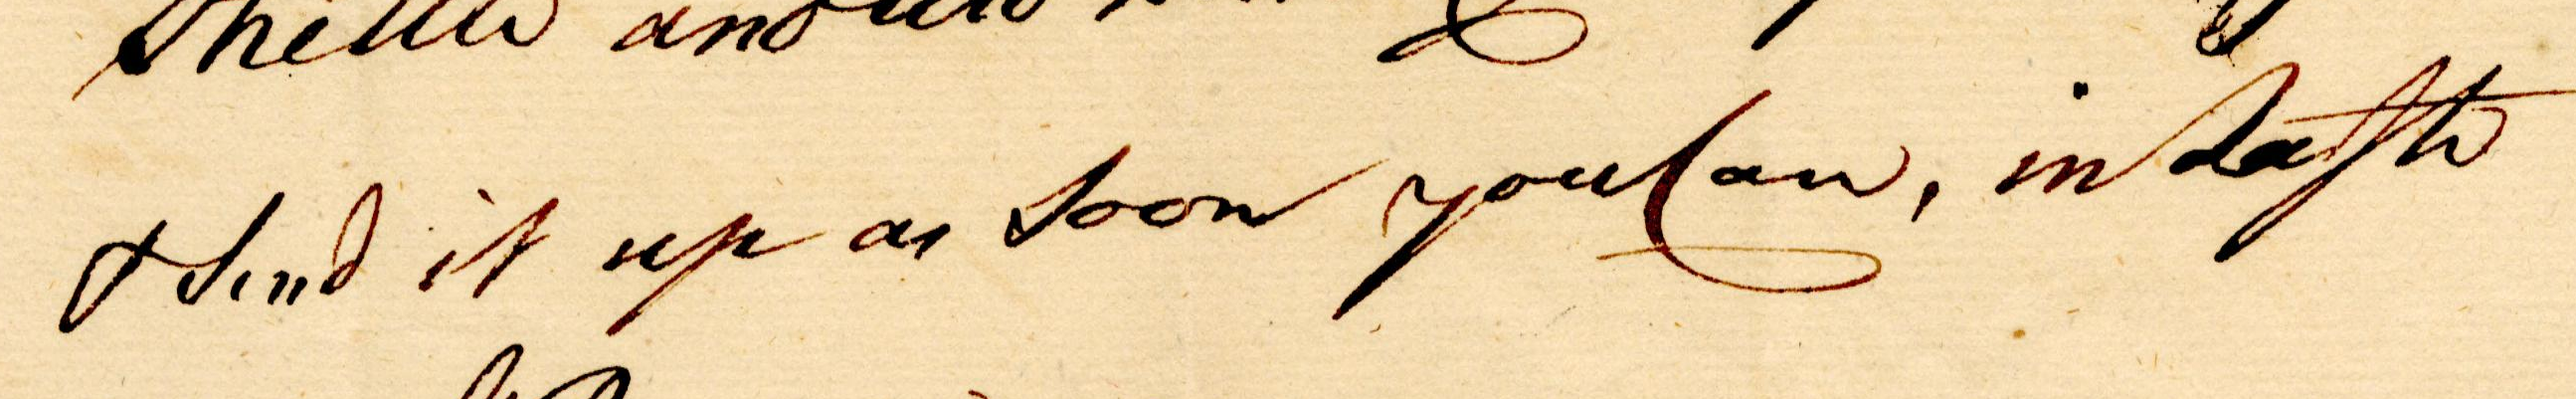& send it up as soon you can, in last
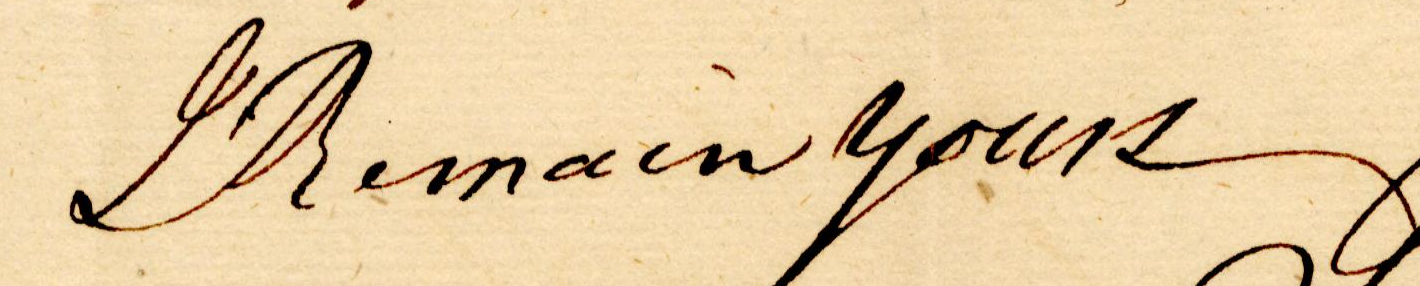I Remain yours
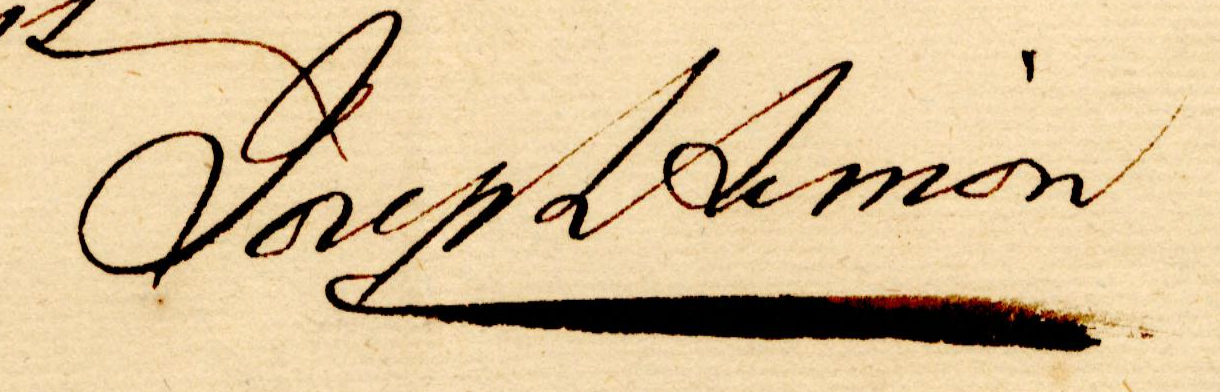Joseph Simon
